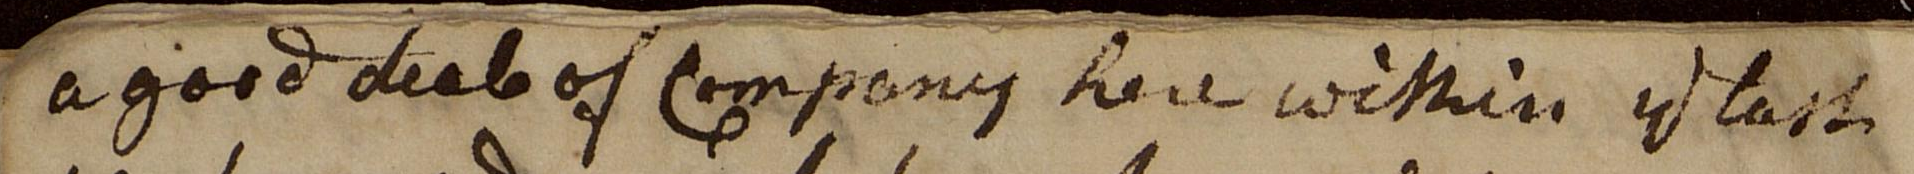a good deal of Company here within y^e last
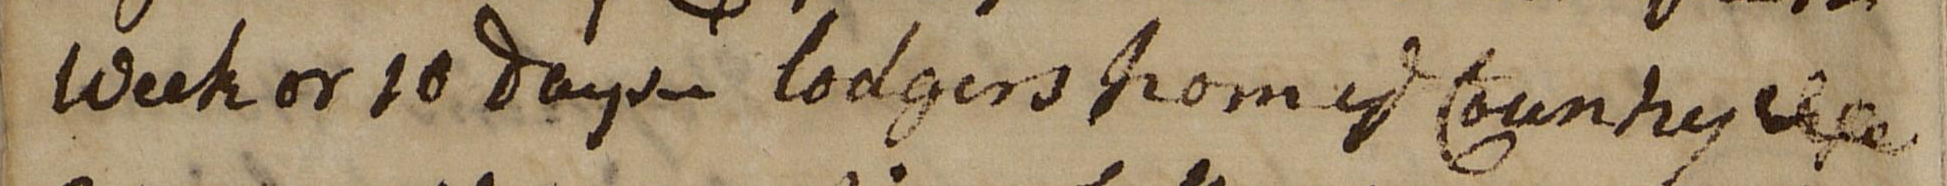Week or 10 days- lodgers from y^e Country &ce
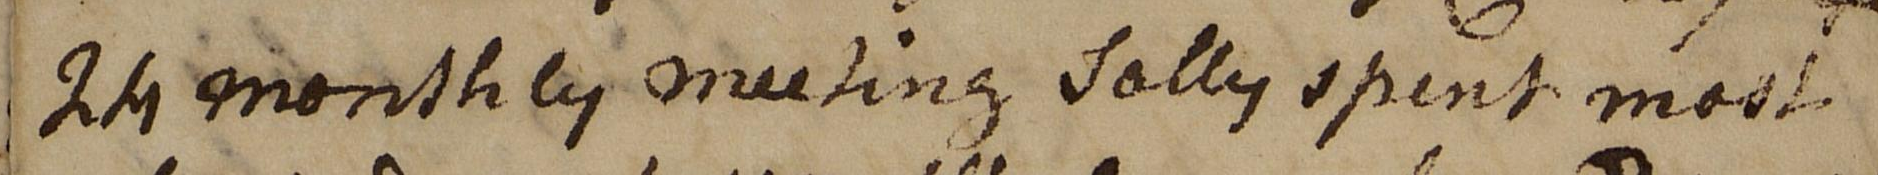24 monthly meeting Sally spent most
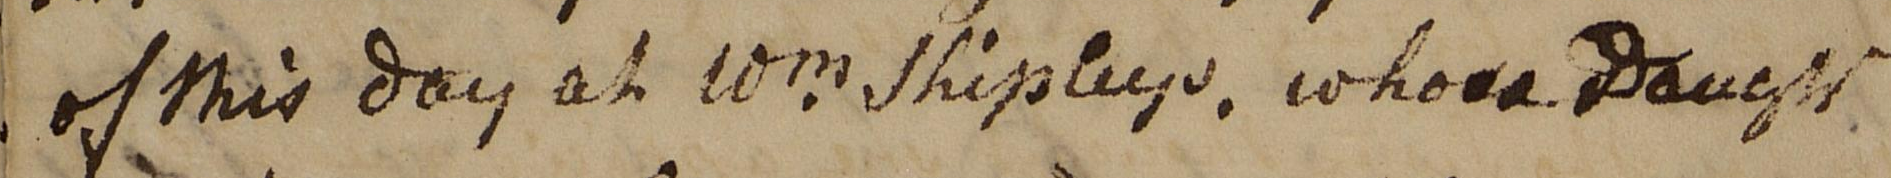of this day at W^m. Shipleys, whose Daugh^r
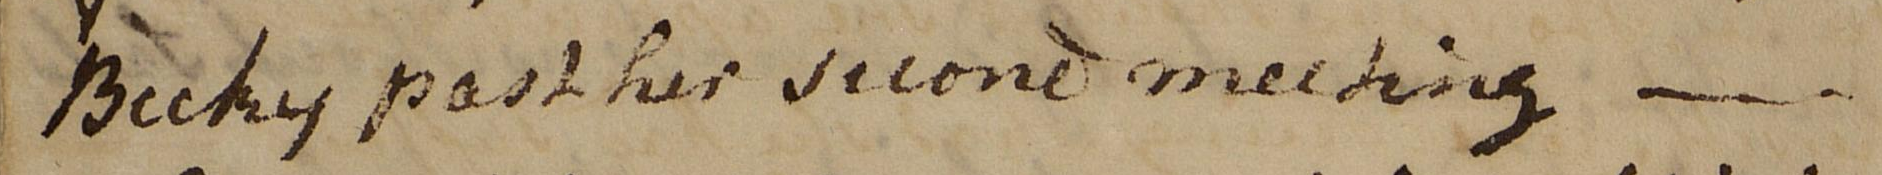Becky past her second meeting-
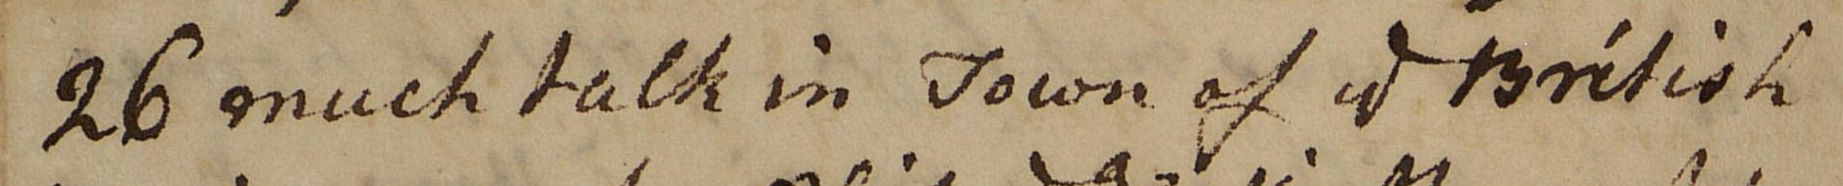26 much talk in Town of y^e British
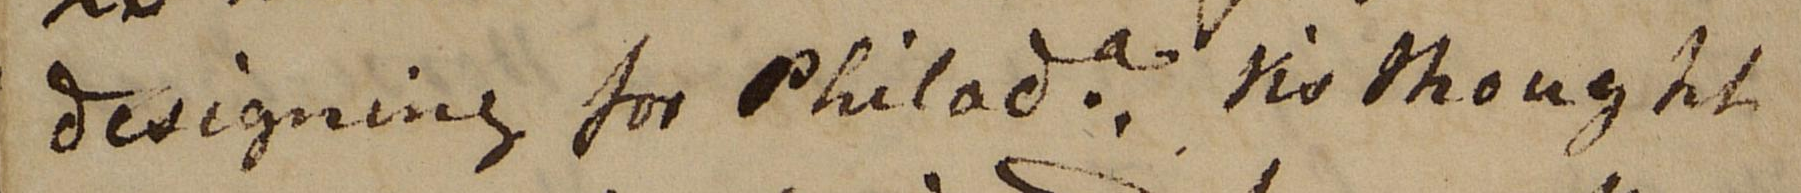designing for Philad^a. tis thought
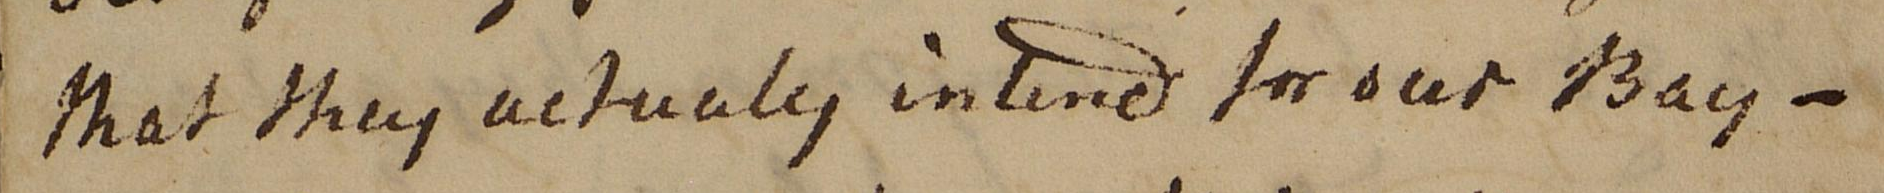that they actualy intend for our Bay-
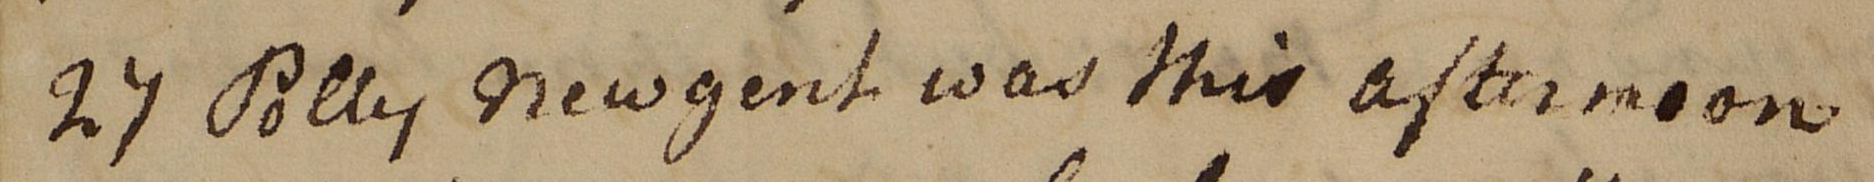27 Polly Newgent was this afternoon
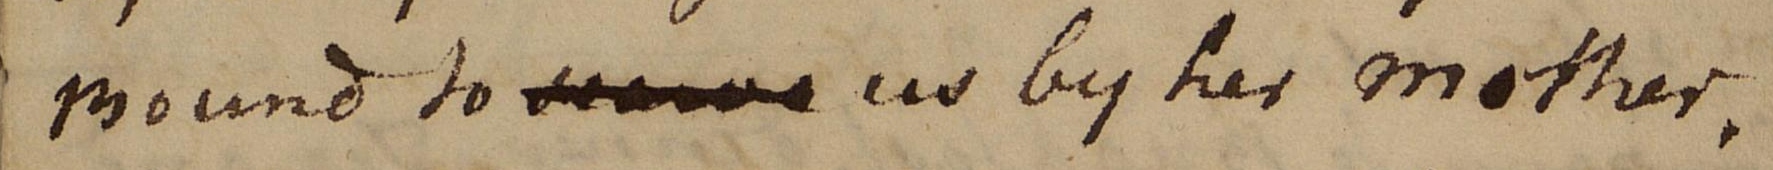Bound to [searve] us by her mother,
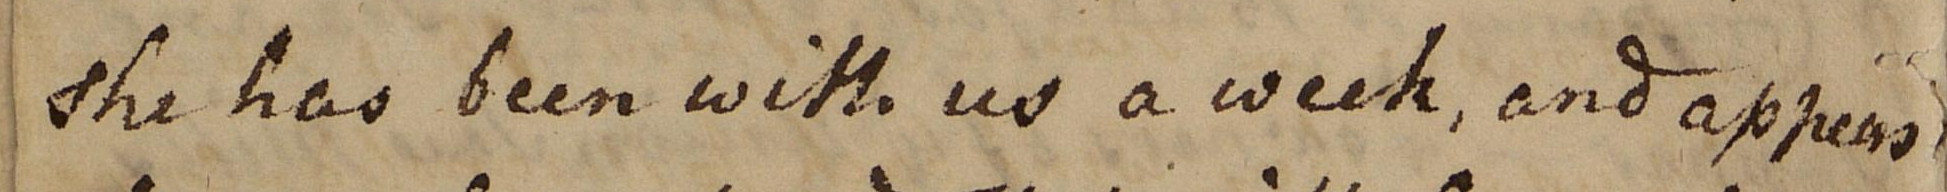she has been with us a week, and appears
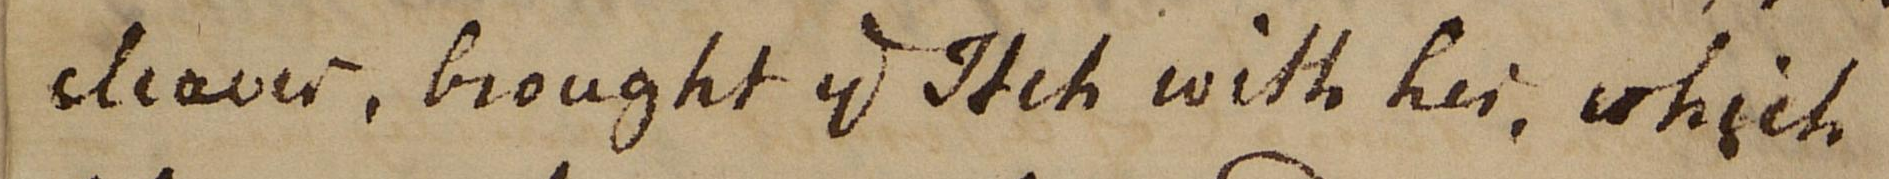cleaver, brought y^e Stek with her, which
